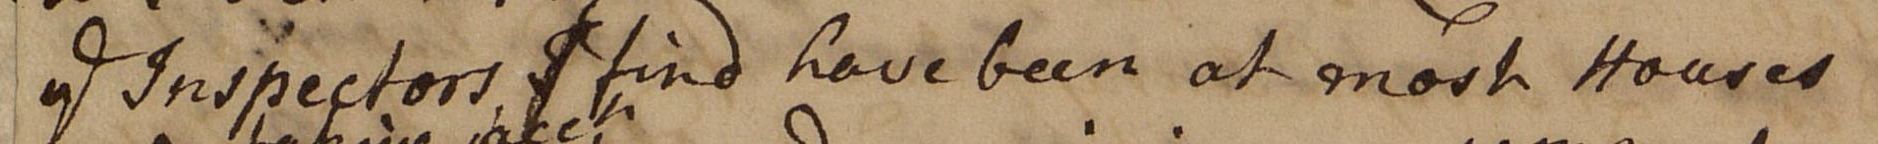y^e Inspectors, I find have been at most Houses
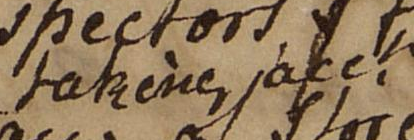taking acc^t.
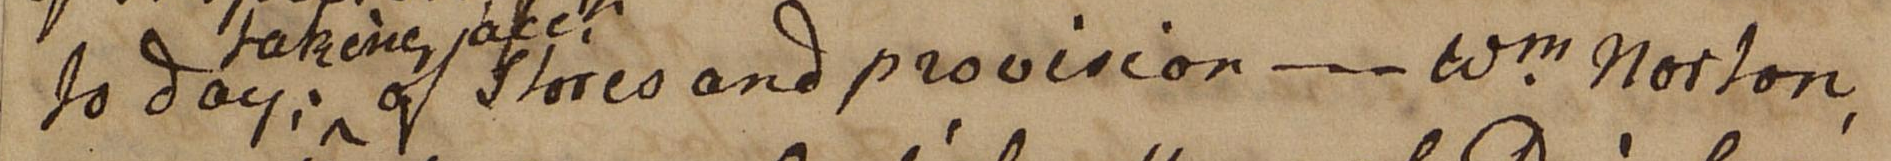to day; ^ of Stores and provision- W^m. Norton,
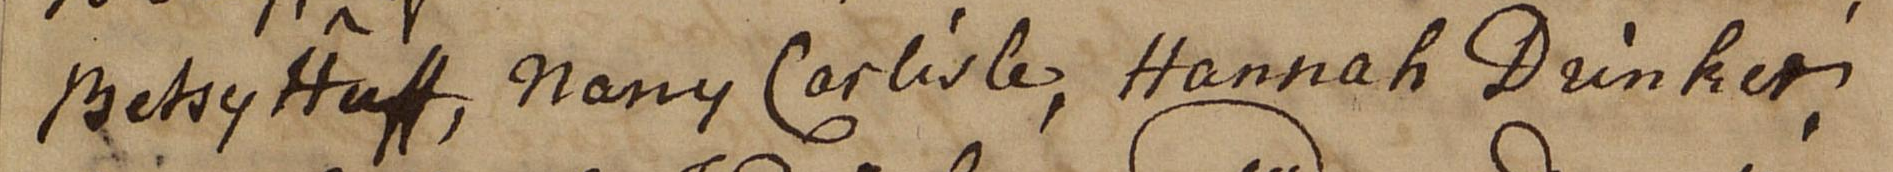Betsy Huff, Nany Carlisle, Hannah Drinker,
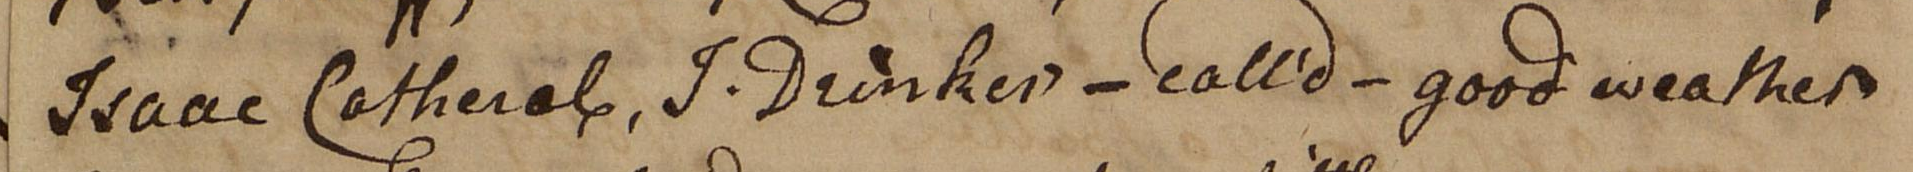Isaac Catheral, I. Drinker- call'd- good weather
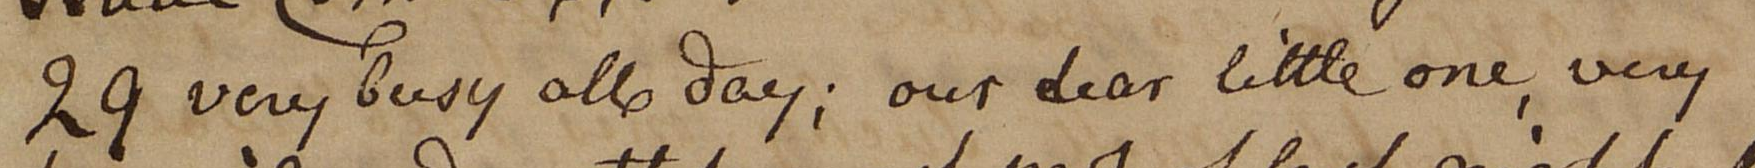29 very busy all day; our dear little one, very
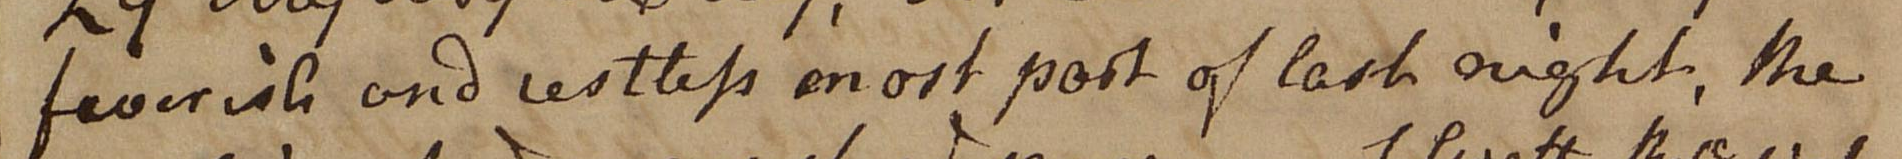feverish and restless most part of last night, the
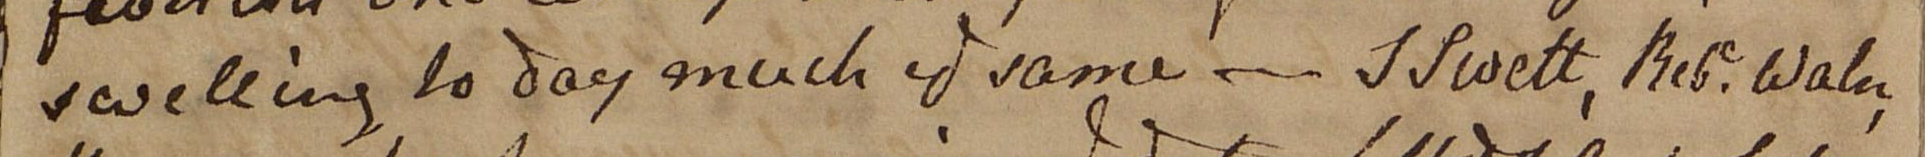swelling to day much y^e same- S Swett, Reb^a. Waln,
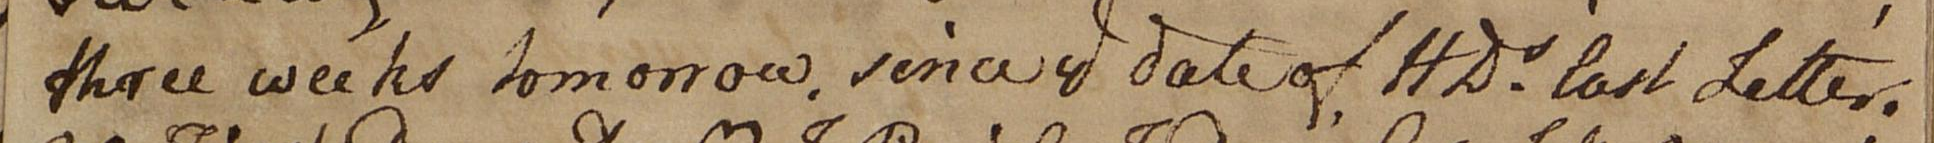three weeks tomorrow, since y^e date of HD^s. last Letter.
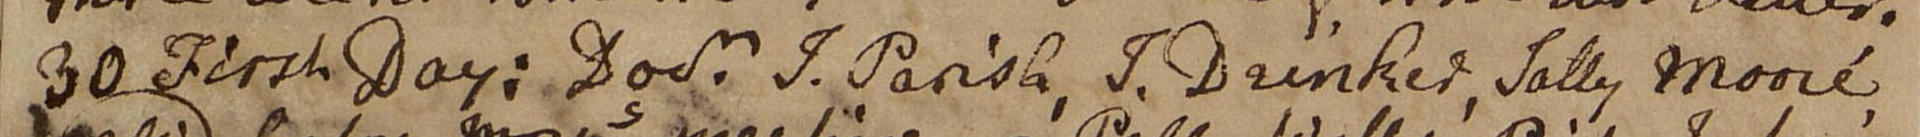30 First Day: Doc^r. I. Parish, T. Drinker, Sally Moore,
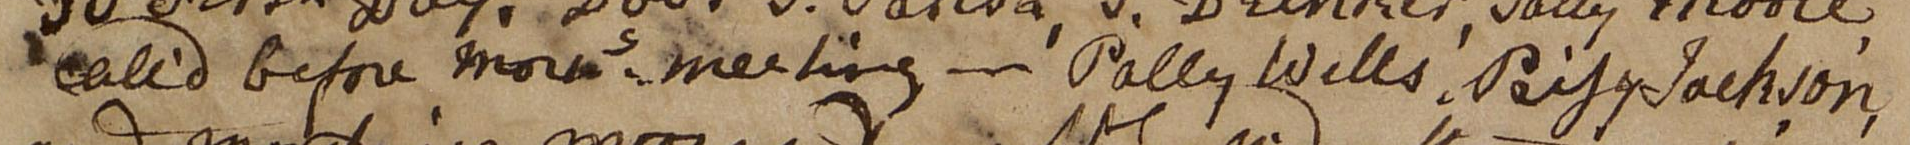call'd before morn^g. meeting- Polly Wells, Paisy Jackson,
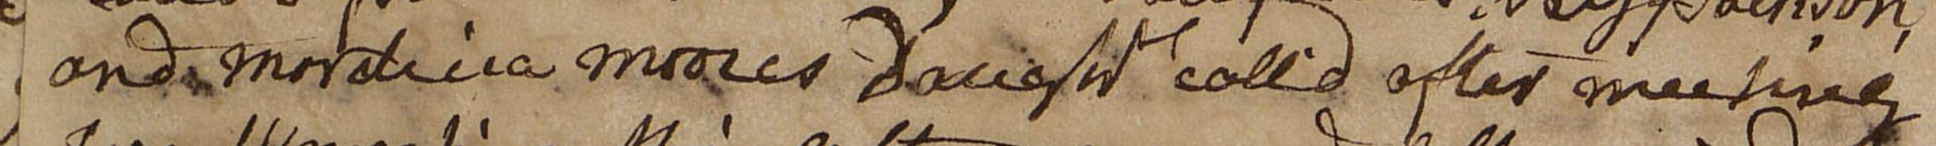and Morticia Moores daugh^r call'd after meeting
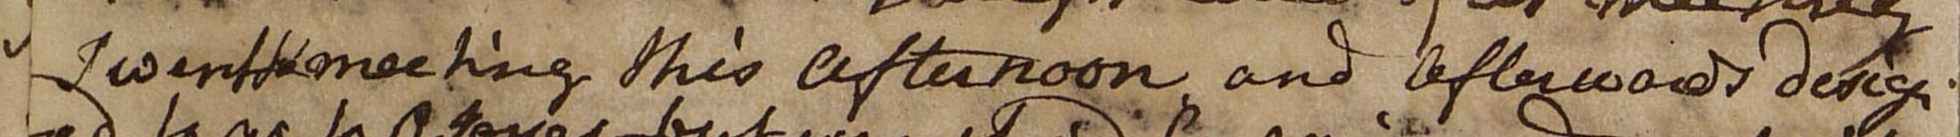I went meeting this Afternoon and Afterwards design
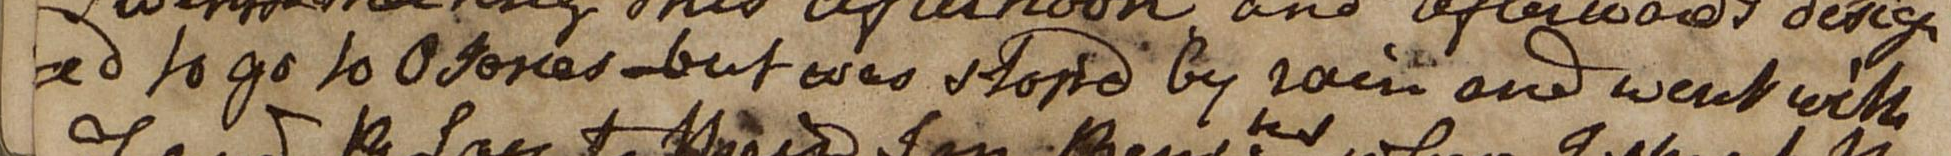-ed to go to O Jones- but was stop'd by rain and went with
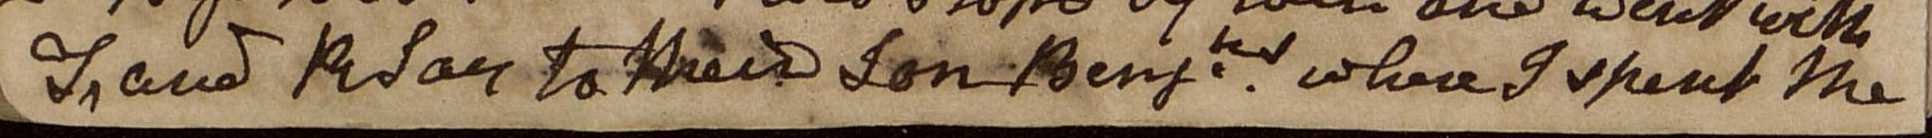S. and R Say to their Son Benj^ns. where I spent the
